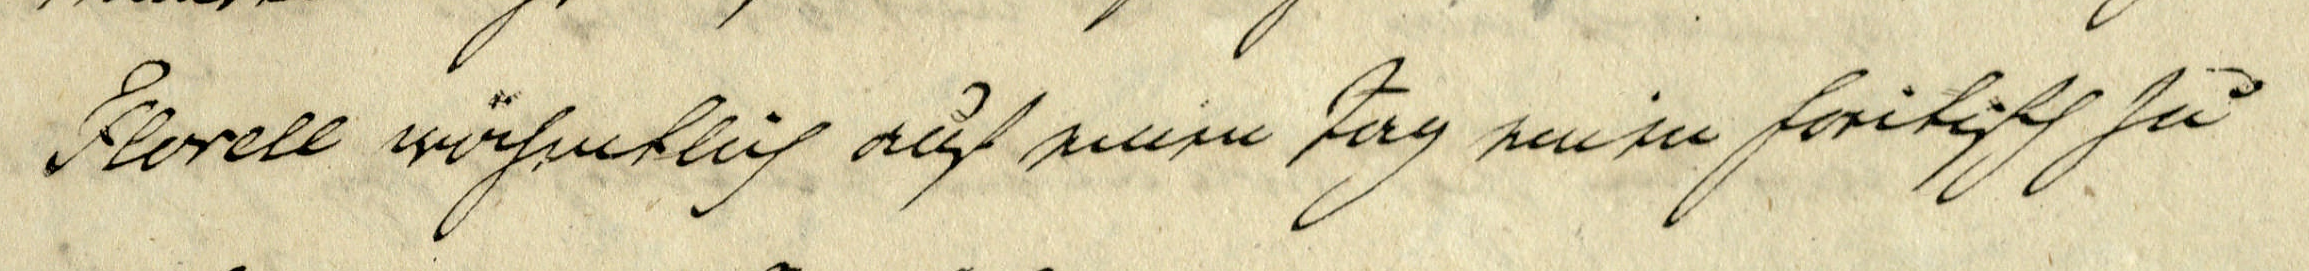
Florell wöchentlich auf einen Tag einen Freitisch zu
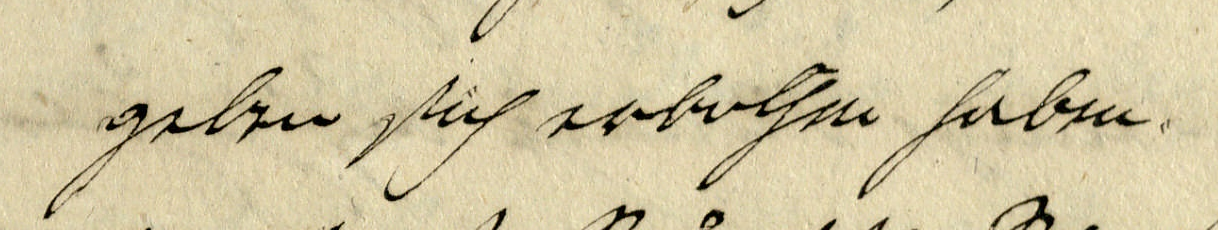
geben sich erbothen haben.
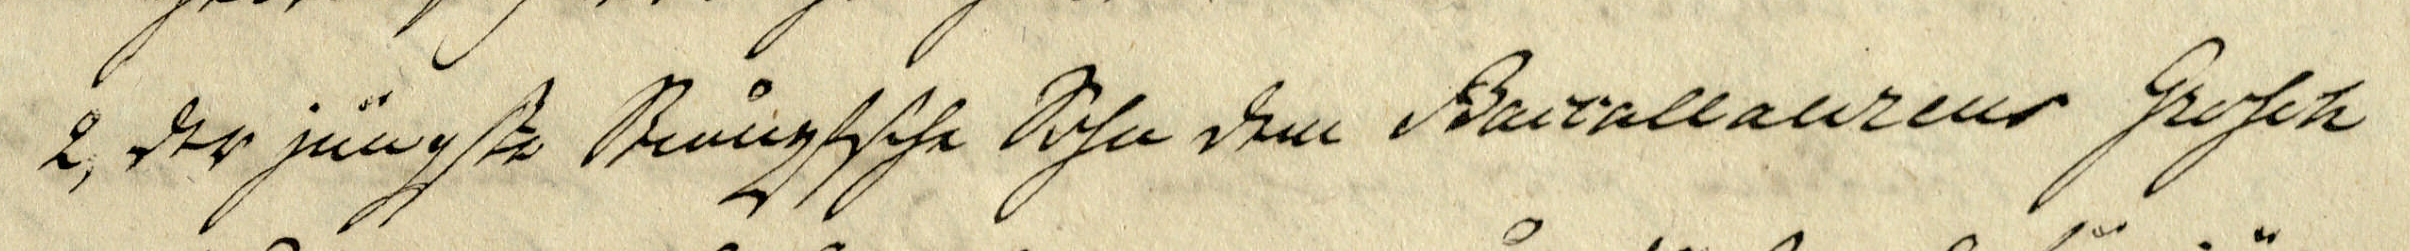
2, der jüngste Stumpfsche Sohn dem Baccallaureus grosch
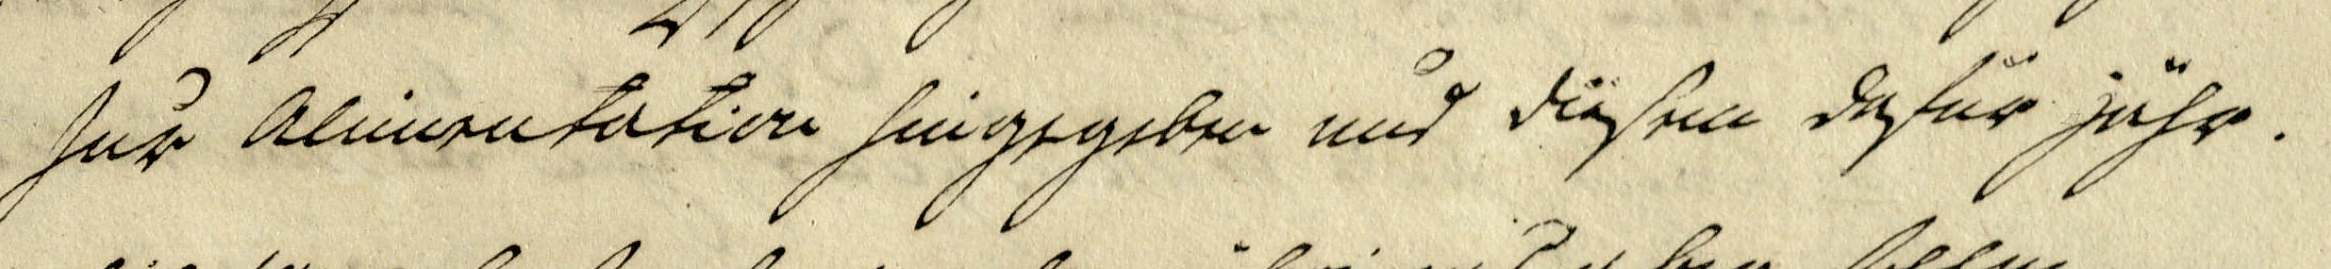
zur Alimentation hingegeben und diesem dafür jähr¬
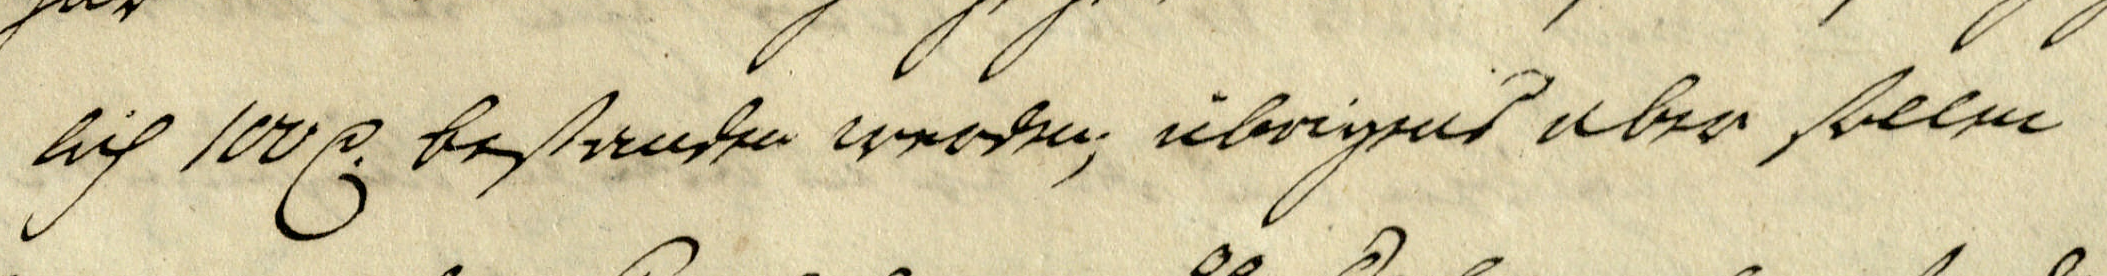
lich 100 l. bestanden werden, übrigens aber stellen
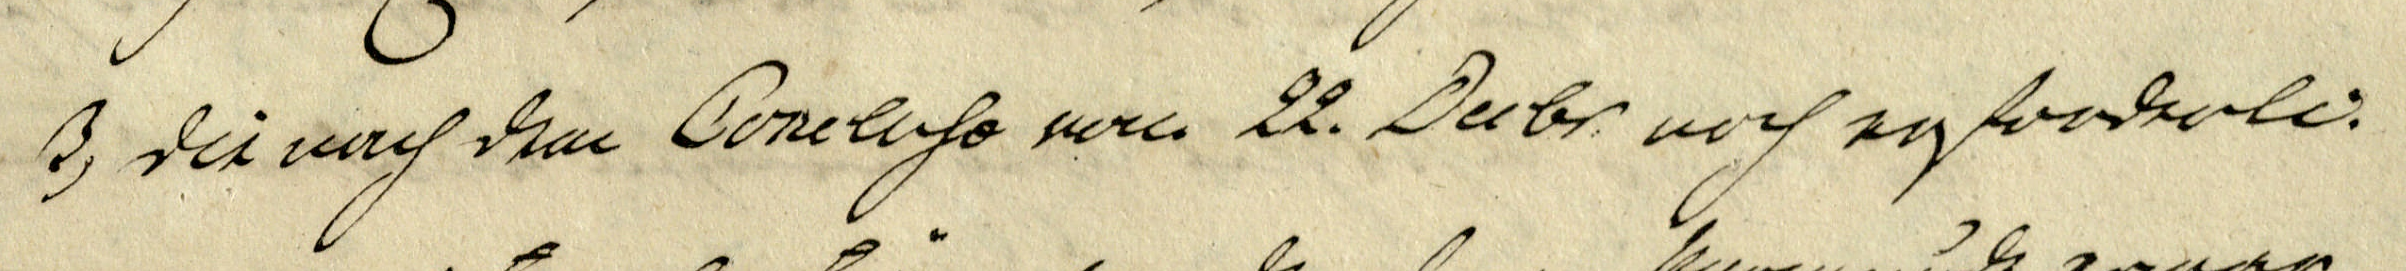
3, die nach dem Concluso vom 22. Decbr. noch erforderli¬
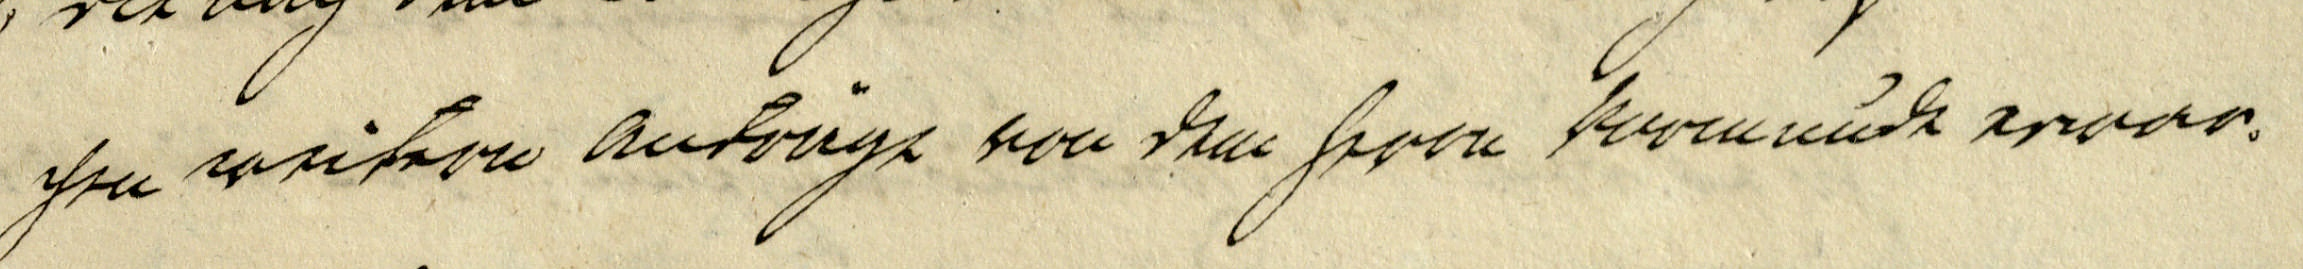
chen weitern Anträge von dem Herrn Vormunde erwar¬
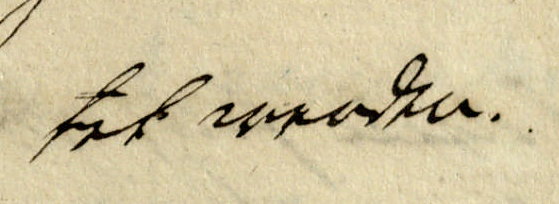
tet werden.
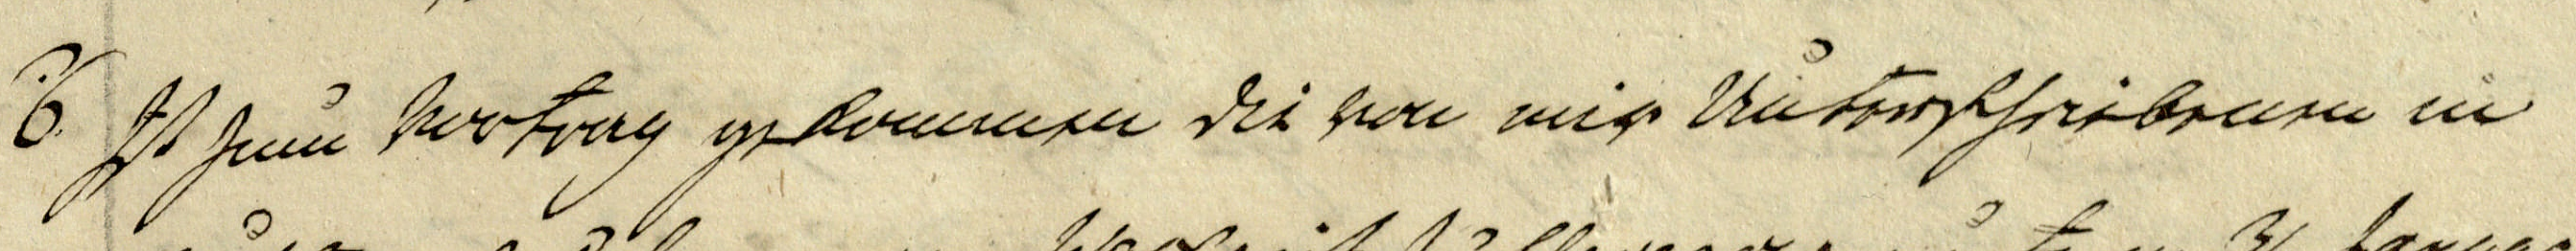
6. Ist zum Vortrag gekommen die von mir Unterschriebenen in
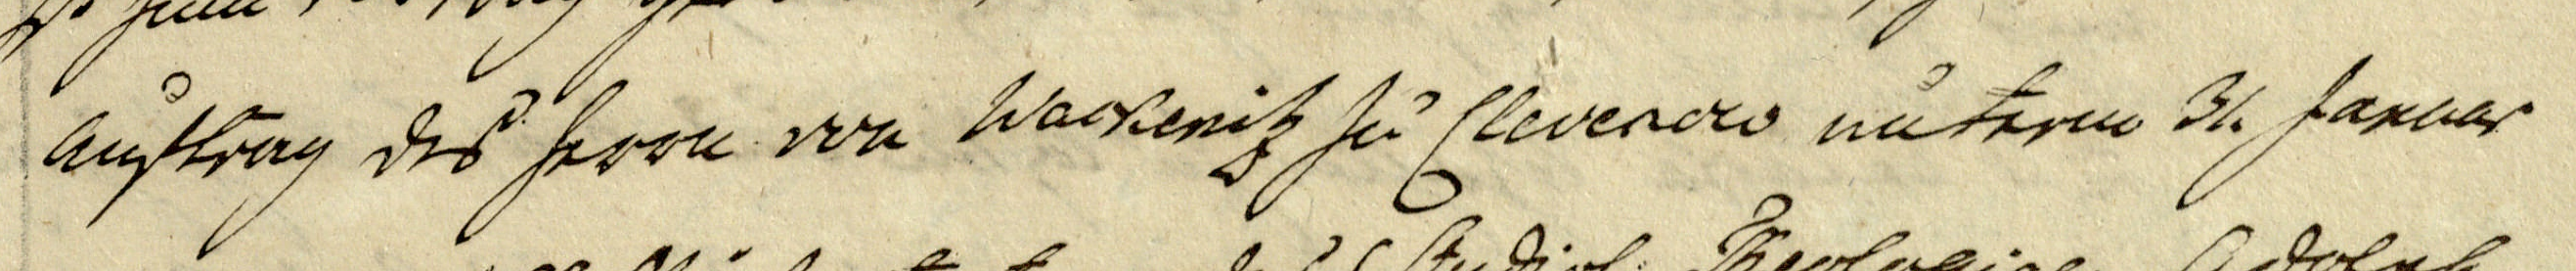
Auftrag des Herrn von Wackenitz zu Clevenow unterm 31. Januar
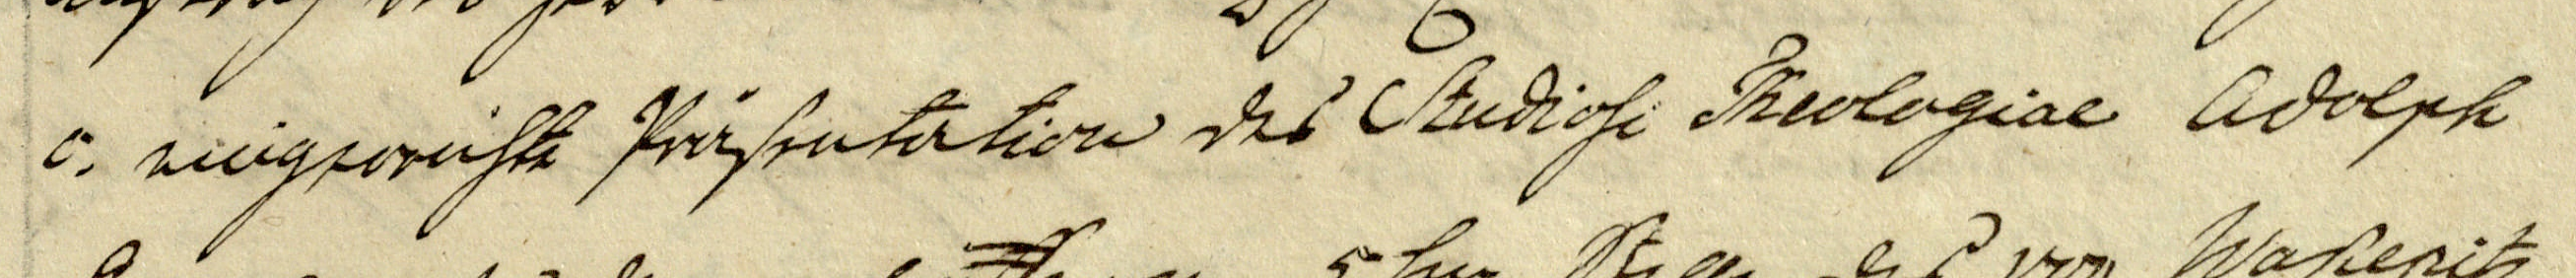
c. eingereichte Präsentation des Studiosi Theologiae Adolph
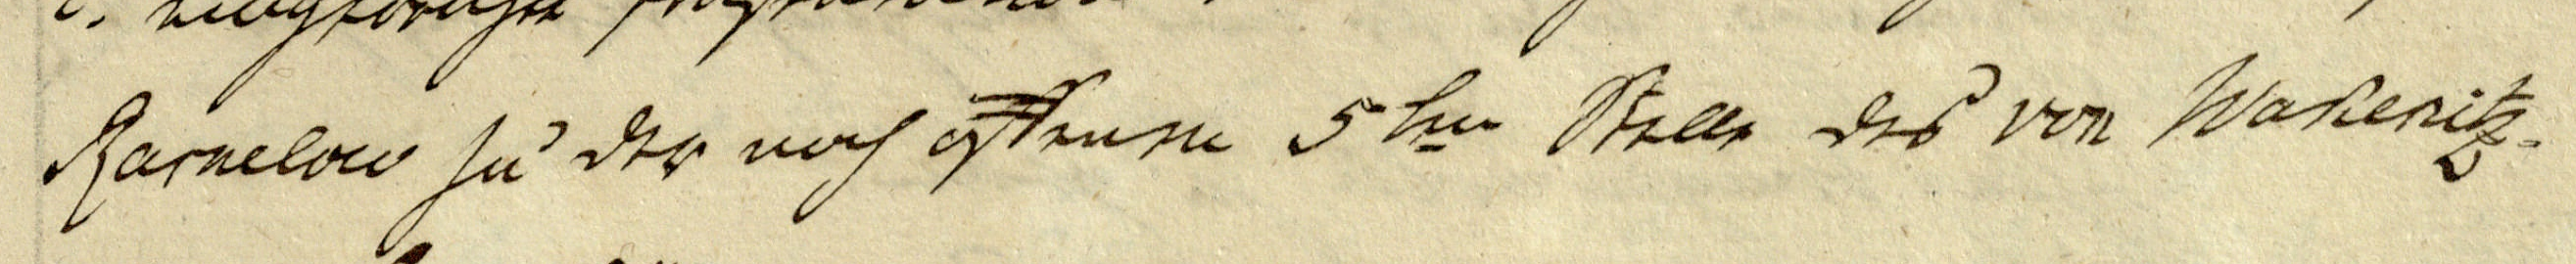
Ramelow zu der noch offenen 5 ten Stelle des von Wakenitz¬
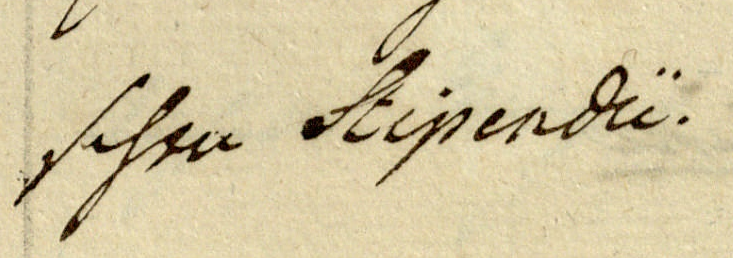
schen Stipendii.
